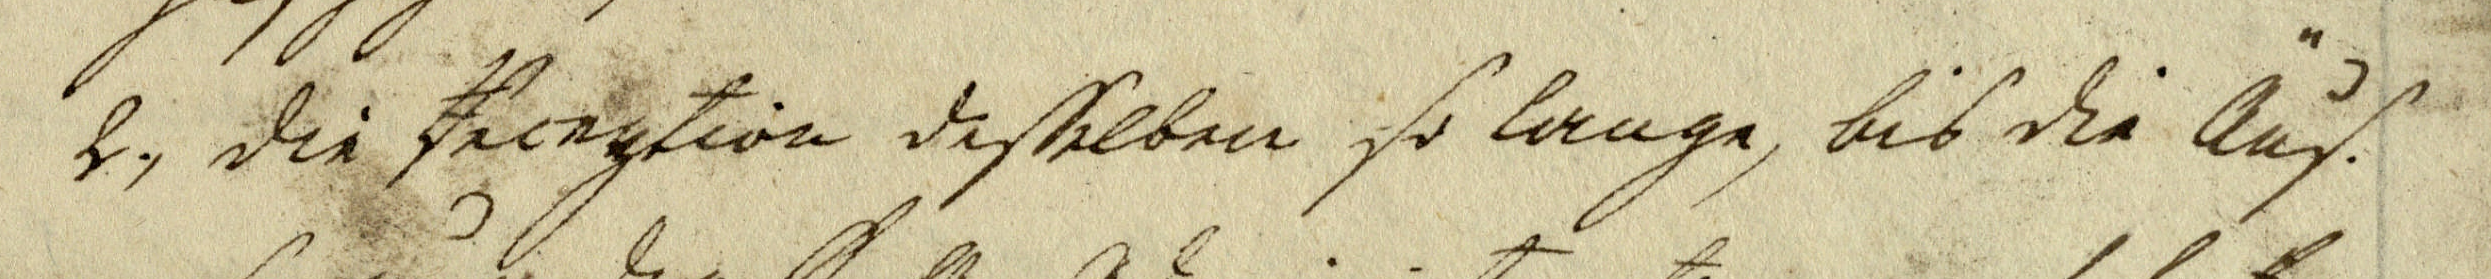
2, die Reception desselben so lange, bis die Äus¬
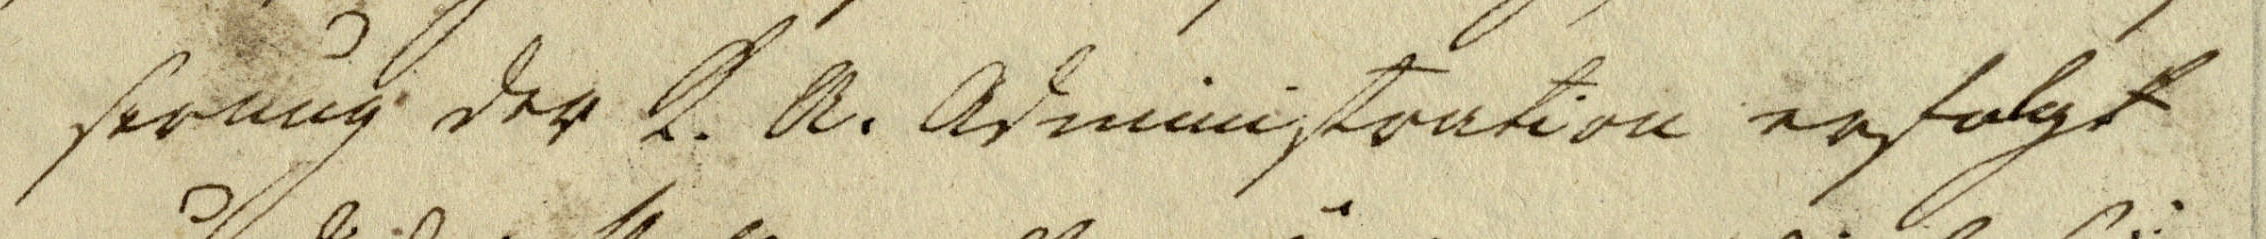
serung der K. A. Administration erfolgt
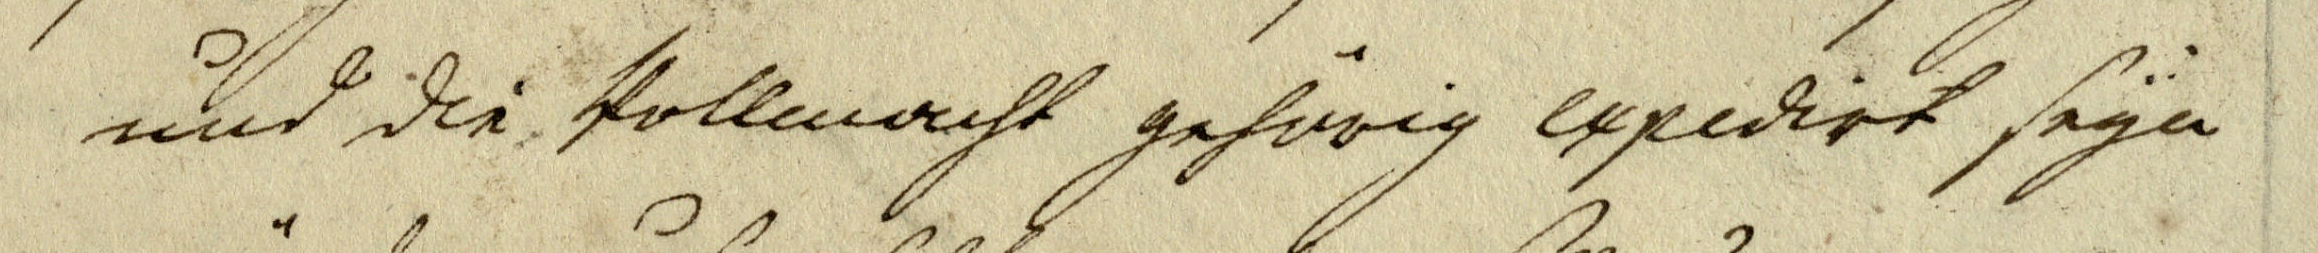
und die Vollmacht gehörig expedirt seÿn
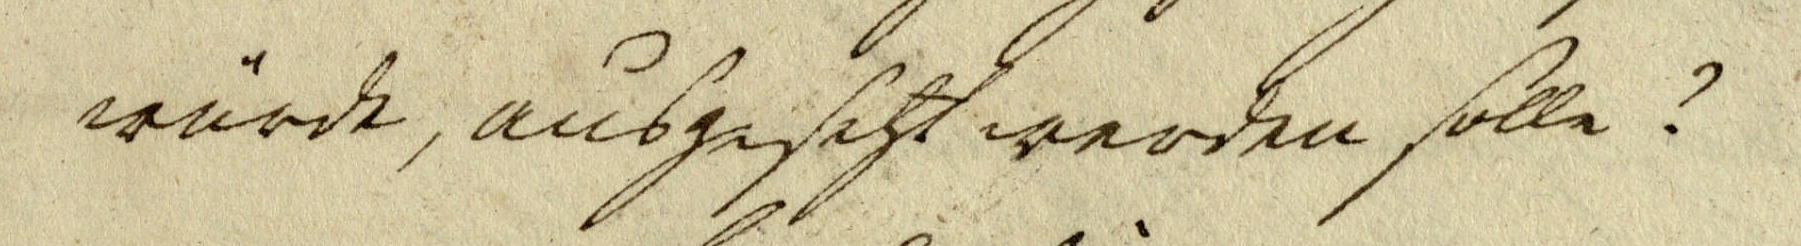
würde, ausgesetzt werden solle?
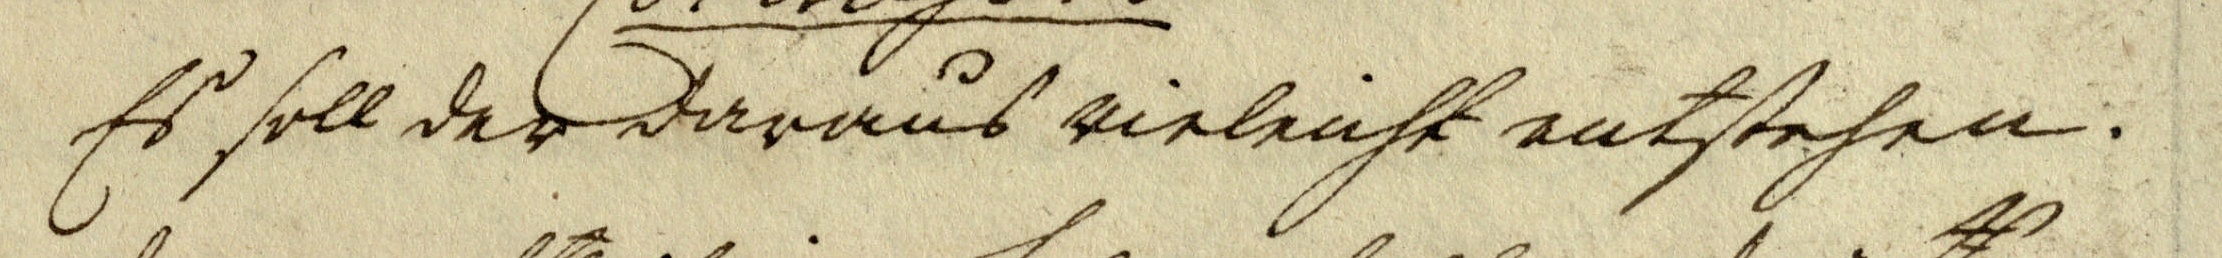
Es soll der daraus vieleicht entstehen¬
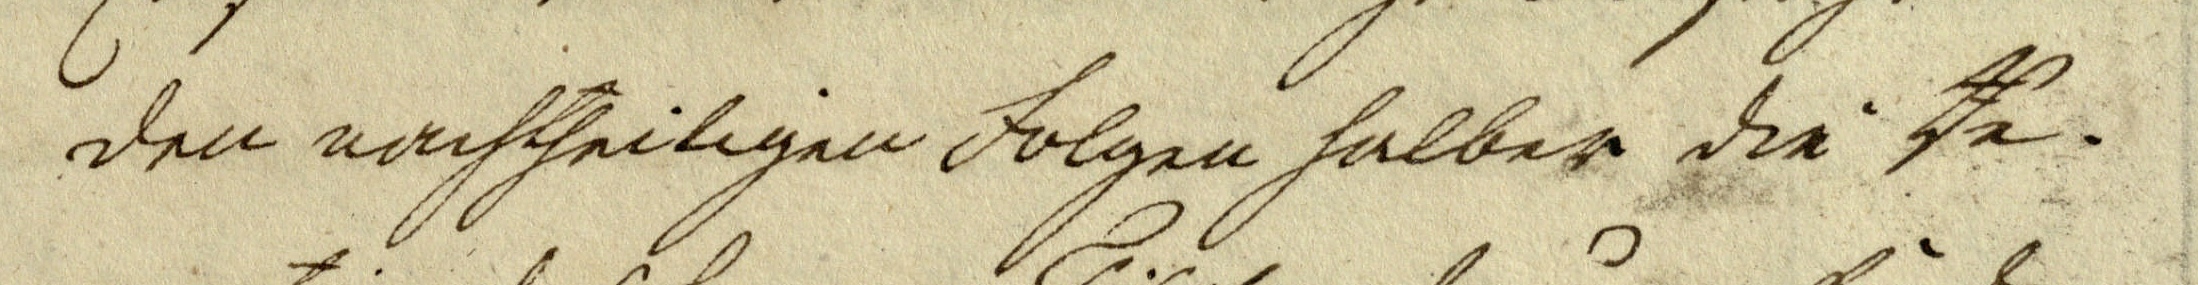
den nachtheiligen Folgen halber die Re¬
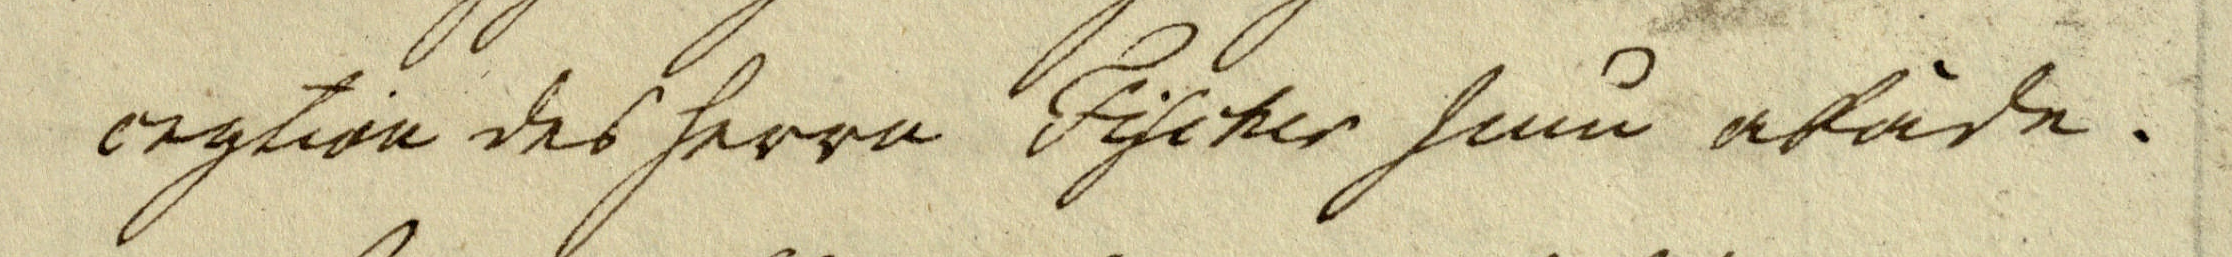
ception des Herrn Fischer zum akade¬
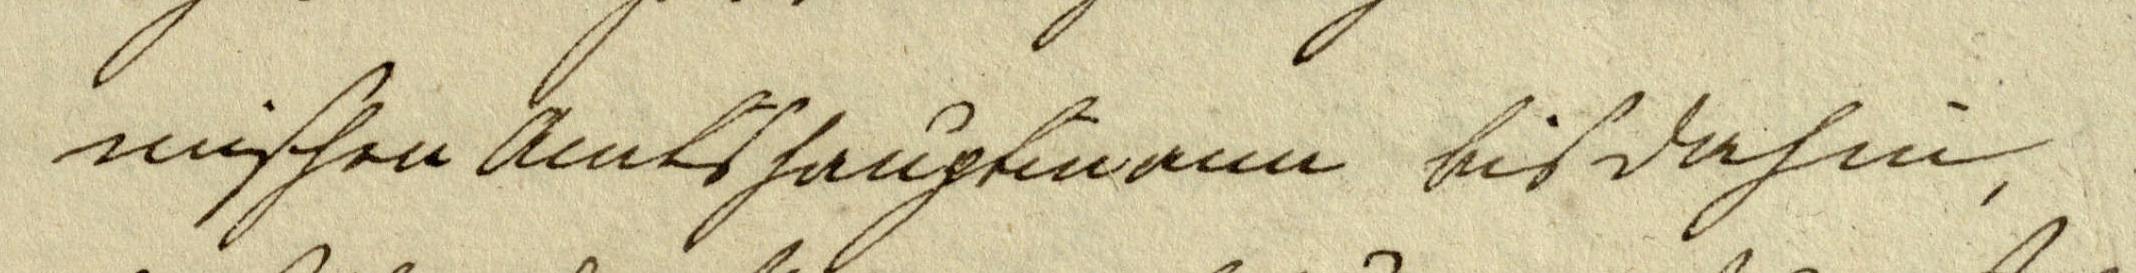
mischen Amtshauptmann bis dahin,
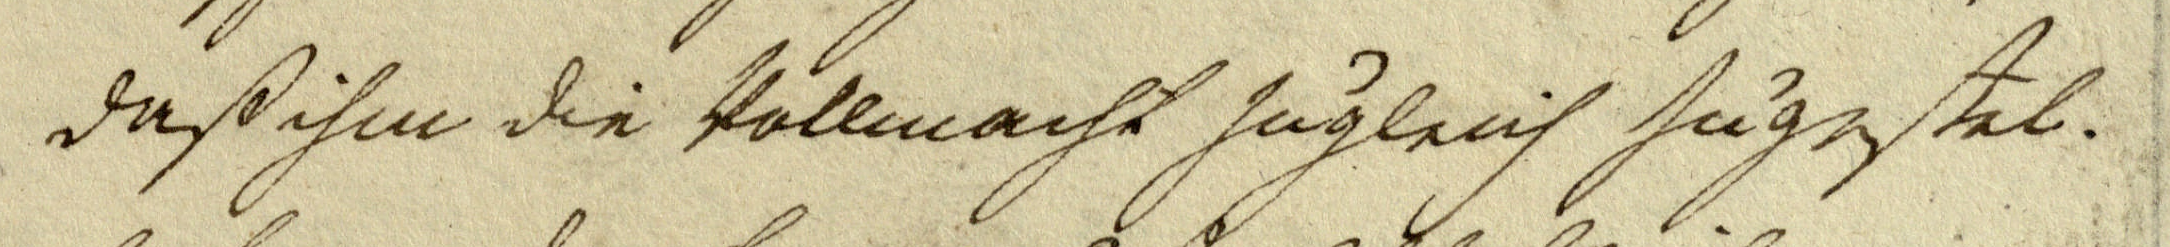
daß ihm die Vollmacht zugleich zugestel¬
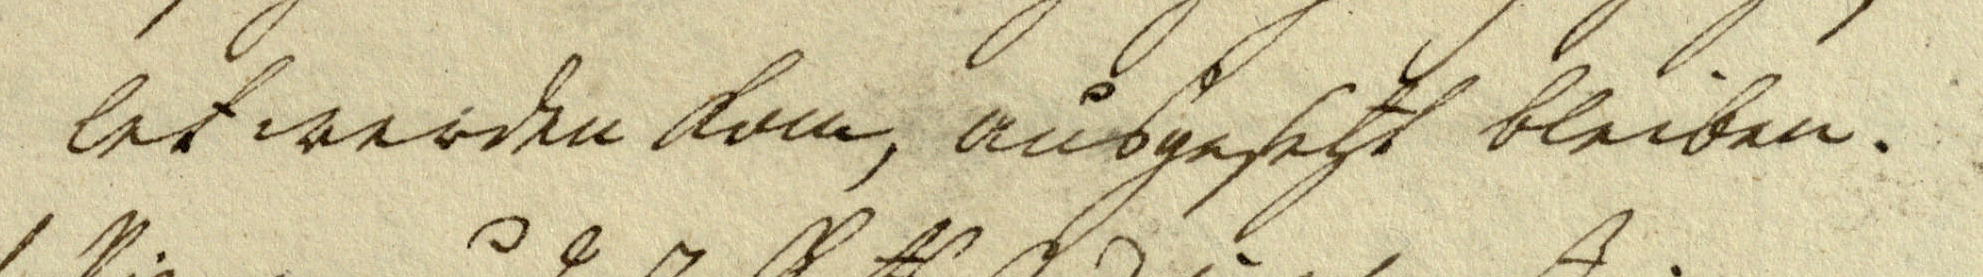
let werden kan, ausgesetzt bleiben.
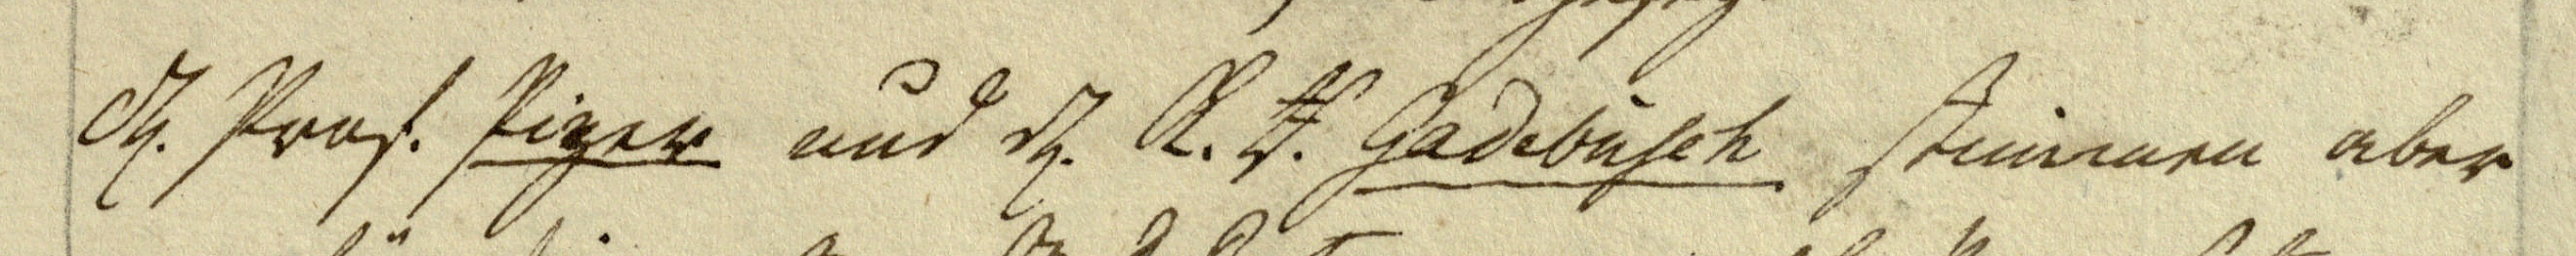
dh. Prof. Piper und dh. K. R. Gadebusch stimmen aber
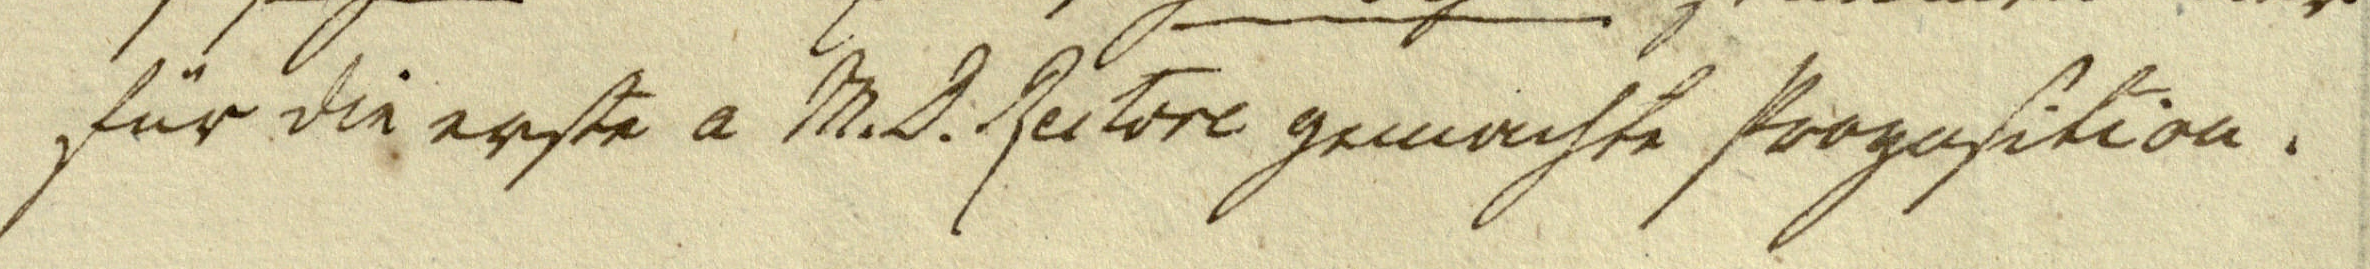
für die erste a M. D. Rectore gemachte Proposition
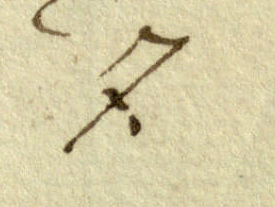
7.
